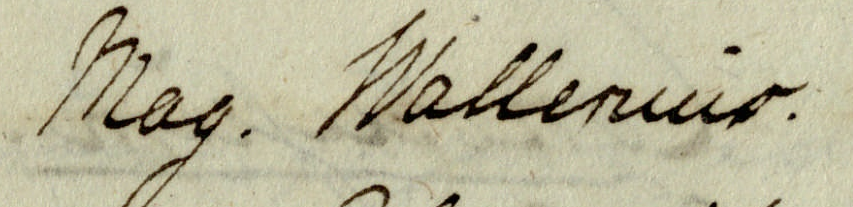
Mag. Wallenius.
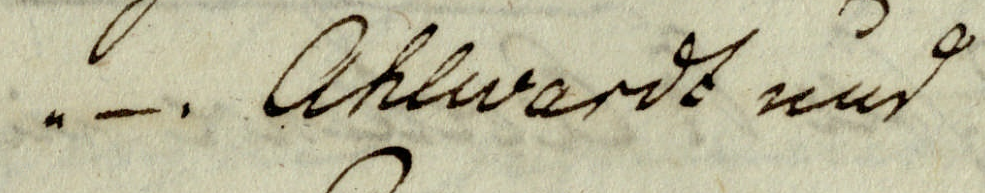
" — . Ahlwardt und
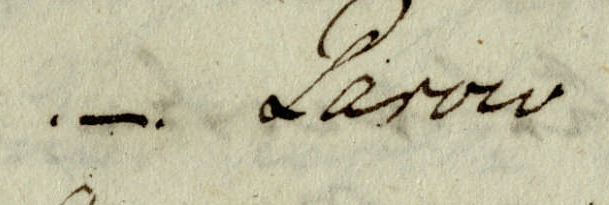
. — . Larow
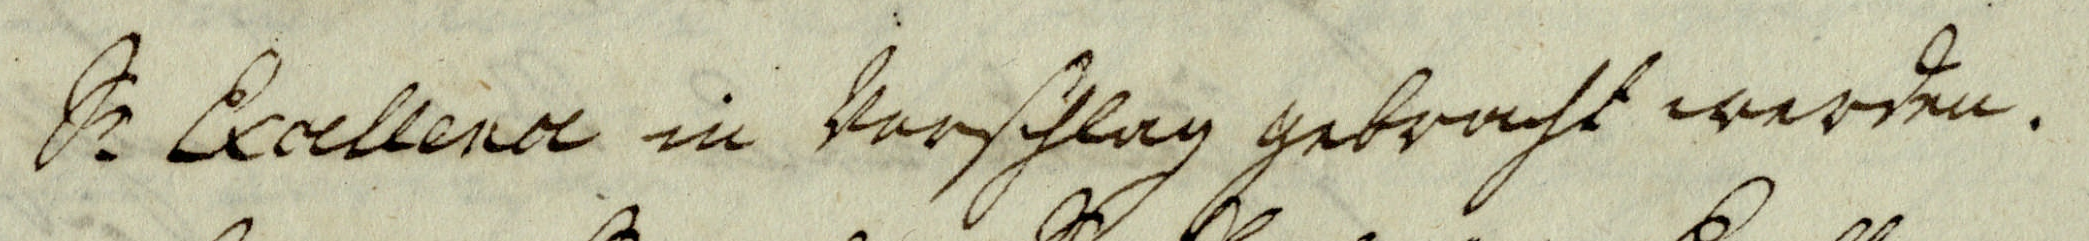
Sr. Excellence in Vorschlag gebracht werden.
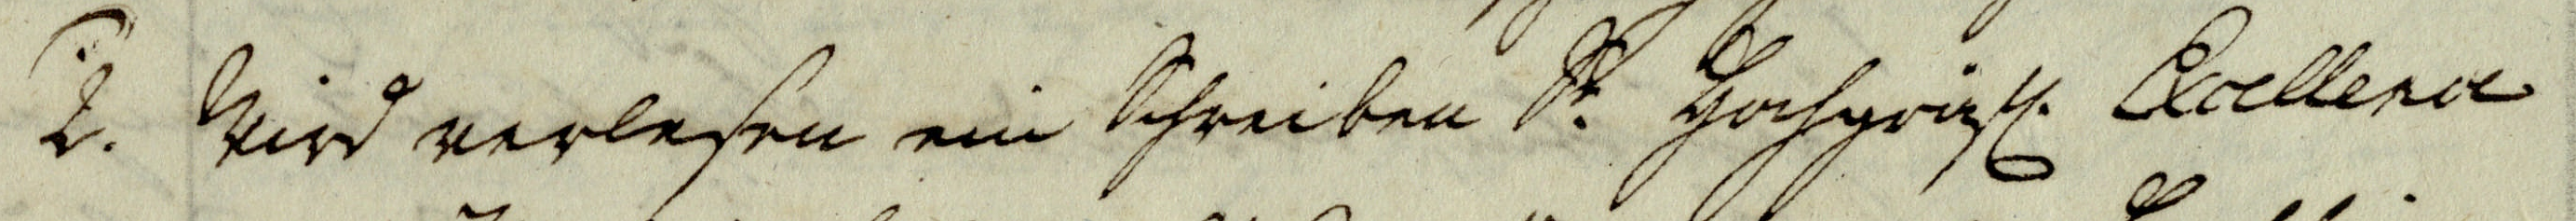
2. Wird verlesen ein Schreiben Sr. Hochgräfl. Excellence
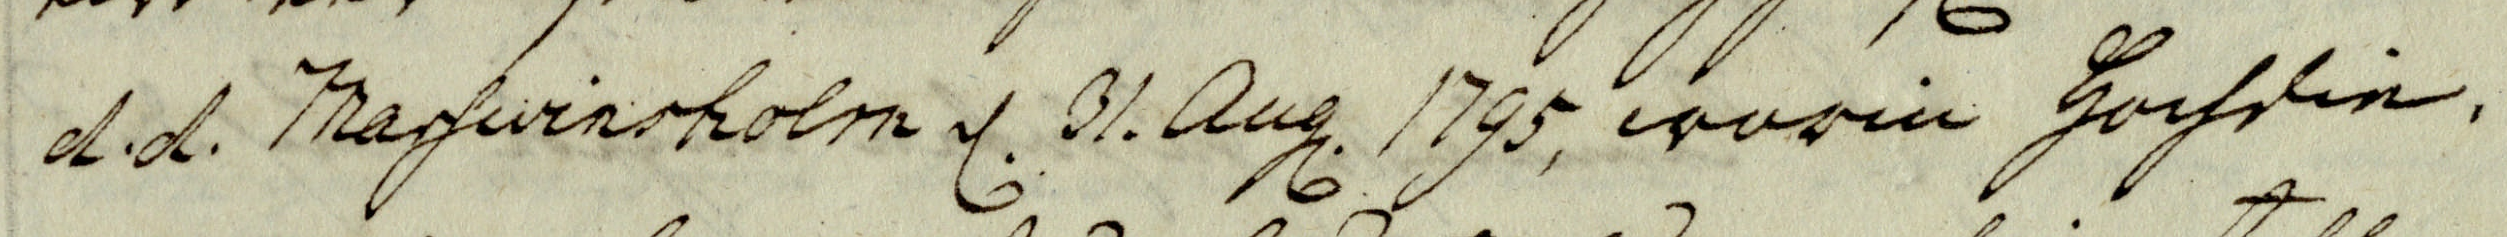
d.d. Marswinsholm d. 31. Aug. 1795, worin Hochdie¬
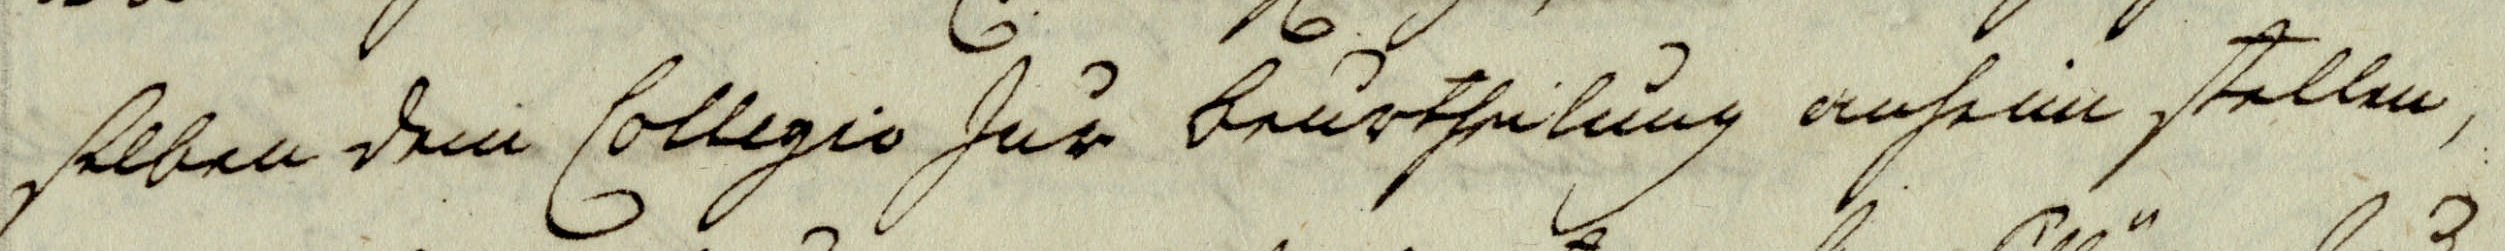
selben dem Collegio zur zur Beurtheilung anheim stellen,
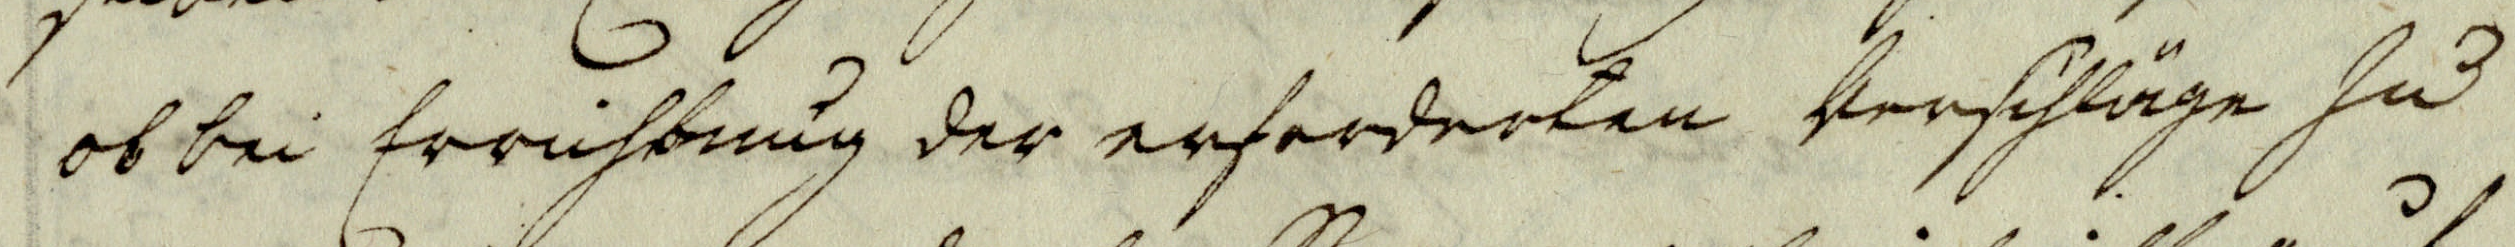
ob bei Errichtung der erforderten Vorschläge zu
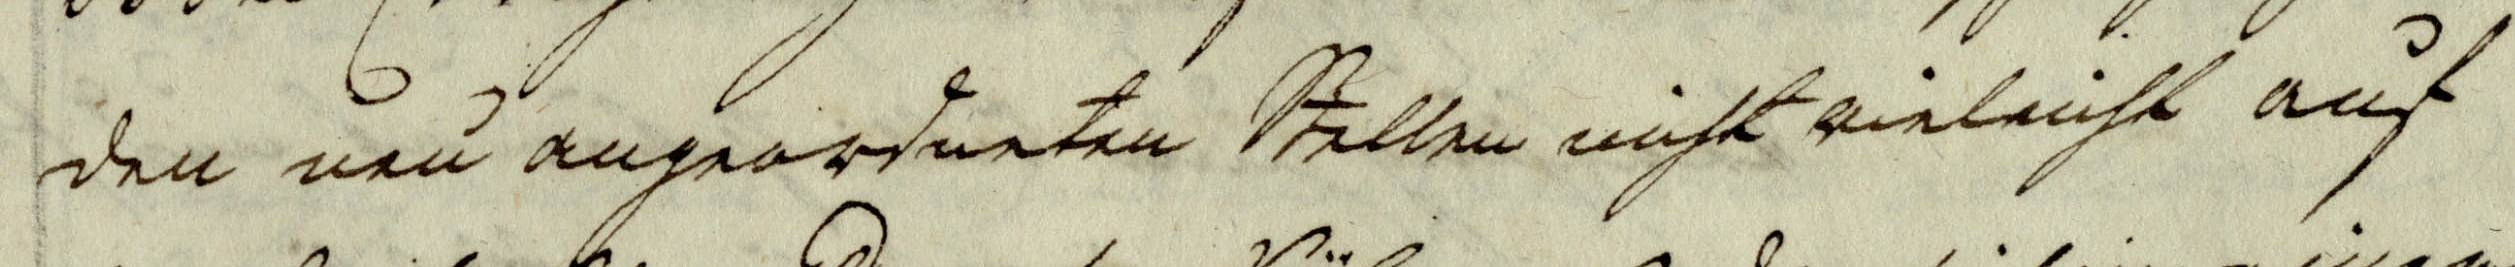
den neu angeordneten Stellen nicht vielleicht auf
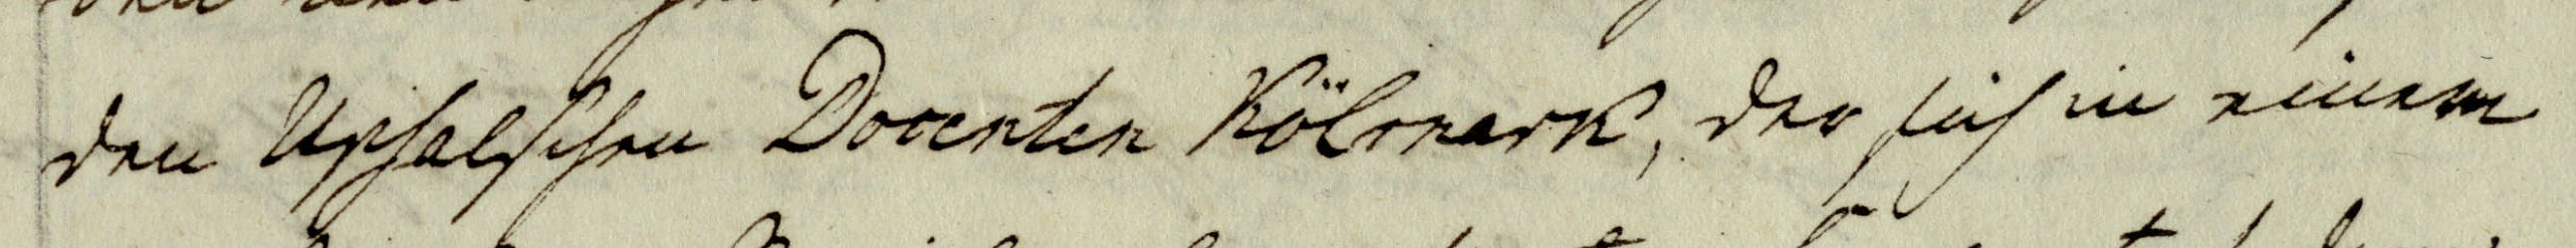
den Upsalschen Docenten Kölmark, der sich in einem
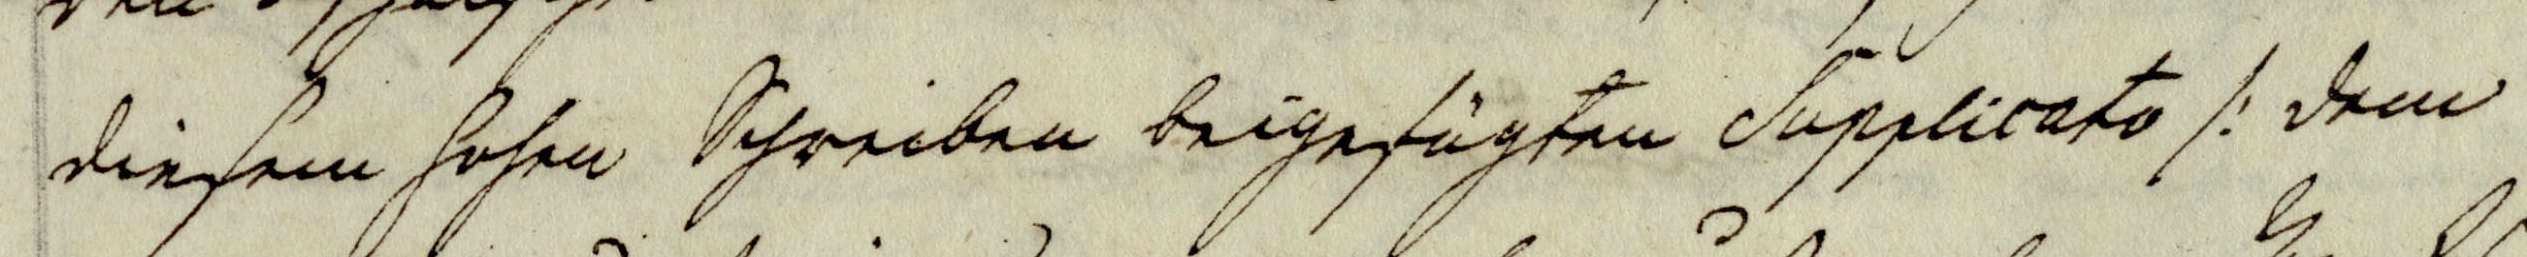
diesem hohen Schreiben beigefügten Supplicato /: dem
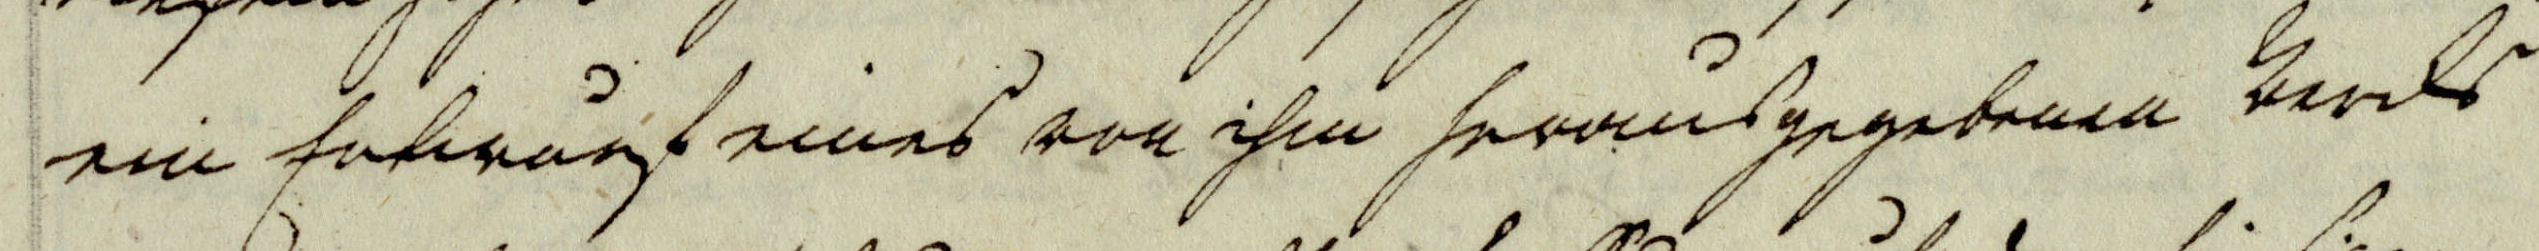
ein Entwurf eines von ihm herausgegebenen Wercks
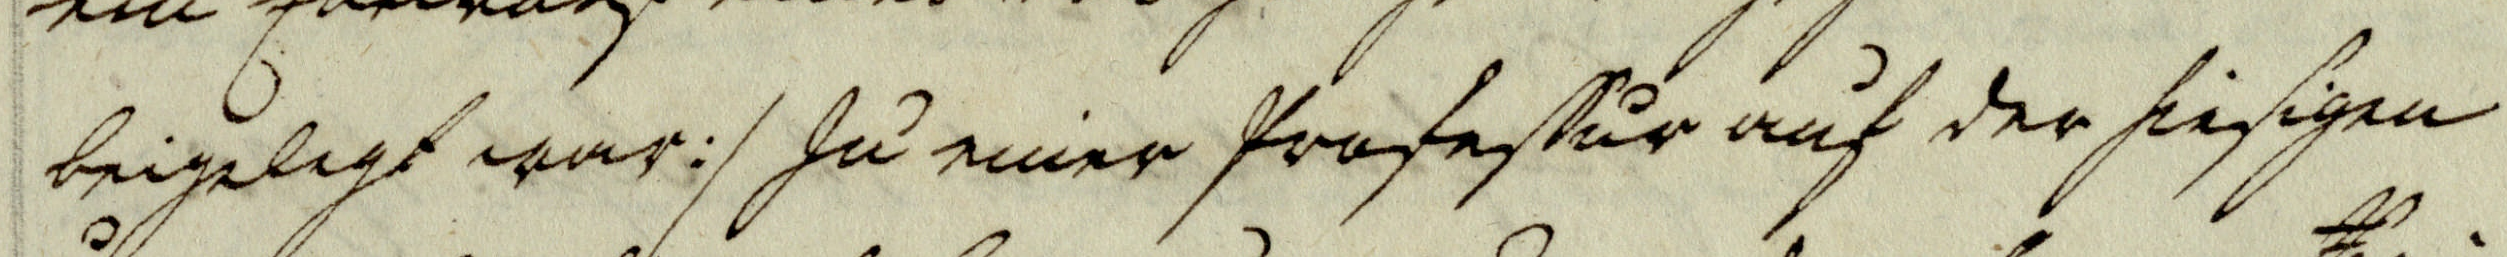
beigelegt war :/ zu einer Professur auf der hiesigen
